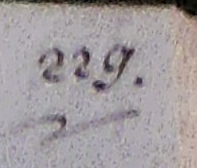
229.
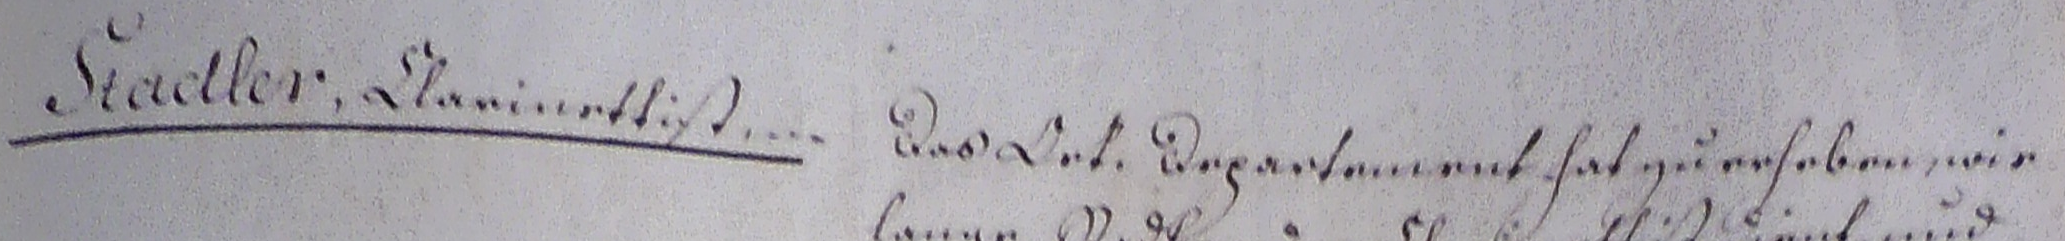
Stadler, Clarinettist . . . . Das Oek. Departement hat zuerheben, wie
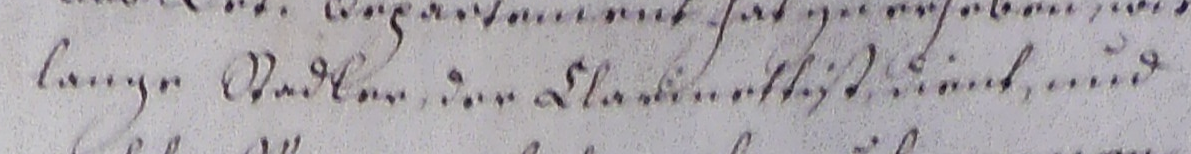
lange Stadler der Clarinettist dient, und
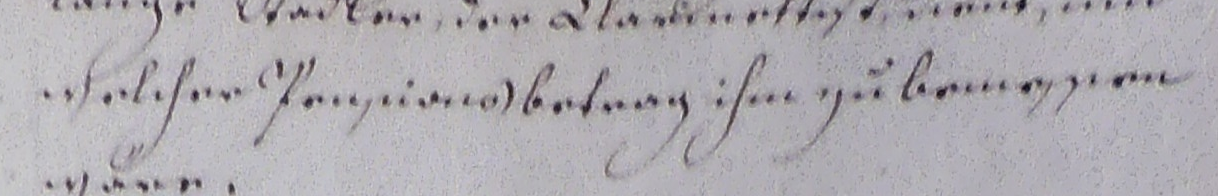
welcher Pensionsbetrag ihm zubemessen
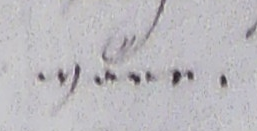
wäre.
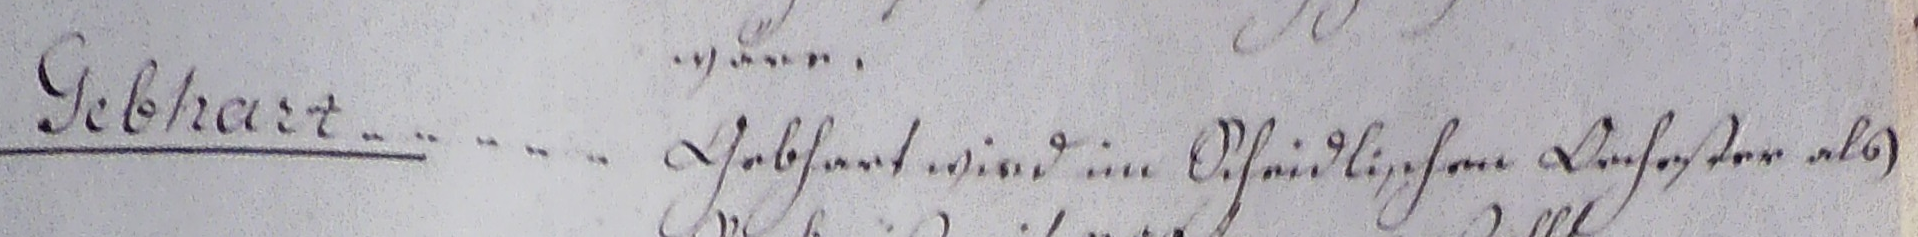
Gebhart .. .. .. .. .. Gebhart wird im Scheidlschen Orchester als
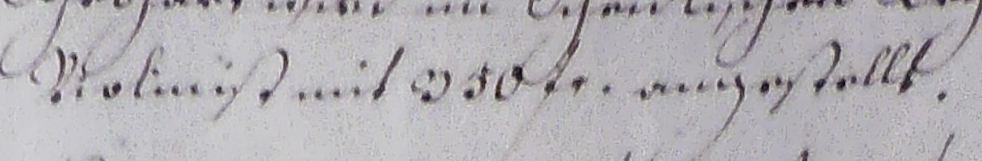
Violonist mit 350fr. angestellt.
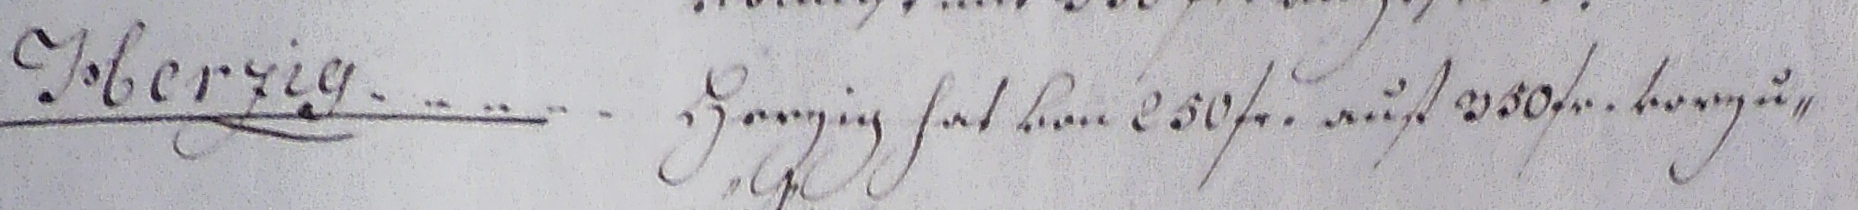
Herzig .. .. .. .. .. Herzig hat von 250fr. auf 350fr. vorzu¬
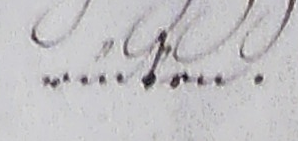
rücken.
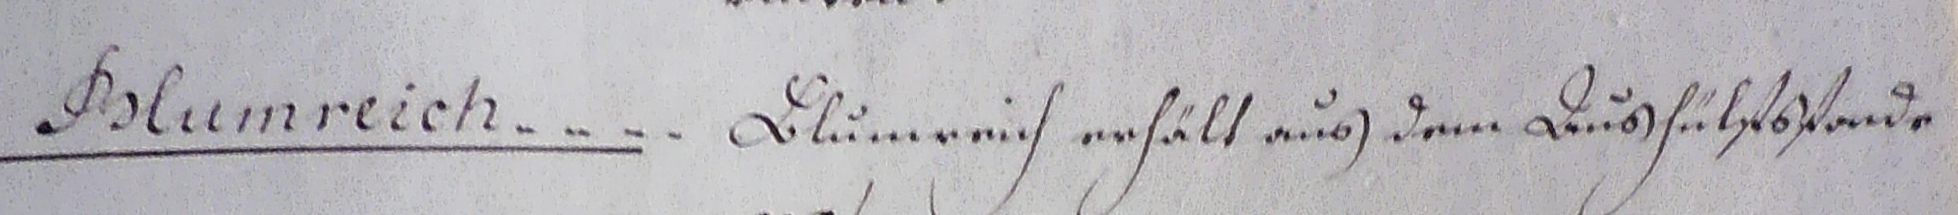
Blumreich .. .. .. .. Blumreich erhält aus dem Aushülfsfonde
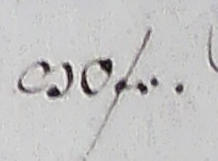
30fr.
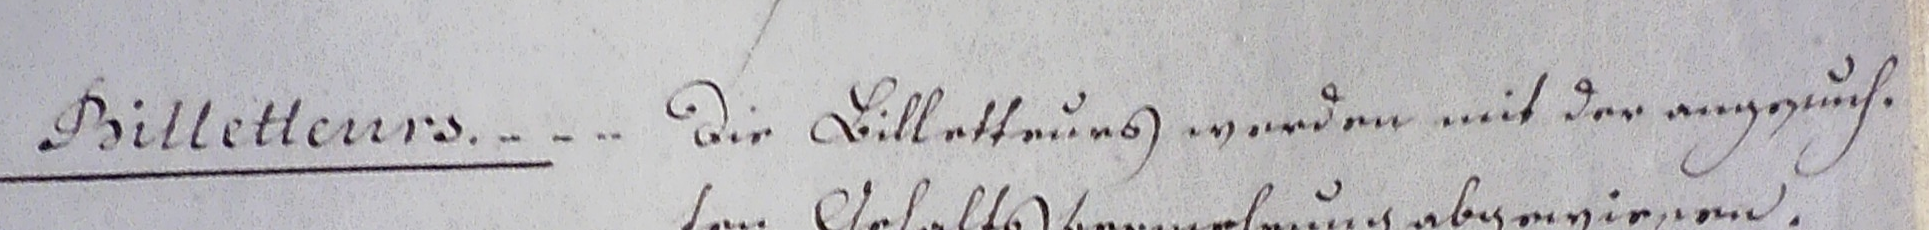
Billetteurs. .. .. .. Die Billetteurs werden mit der angesuch¬
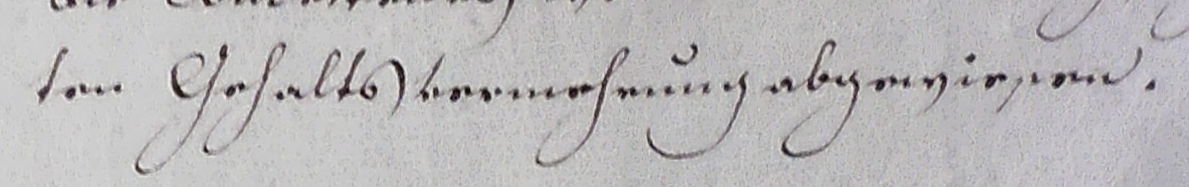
ten Gehaltsvermehrung abgewiesen.
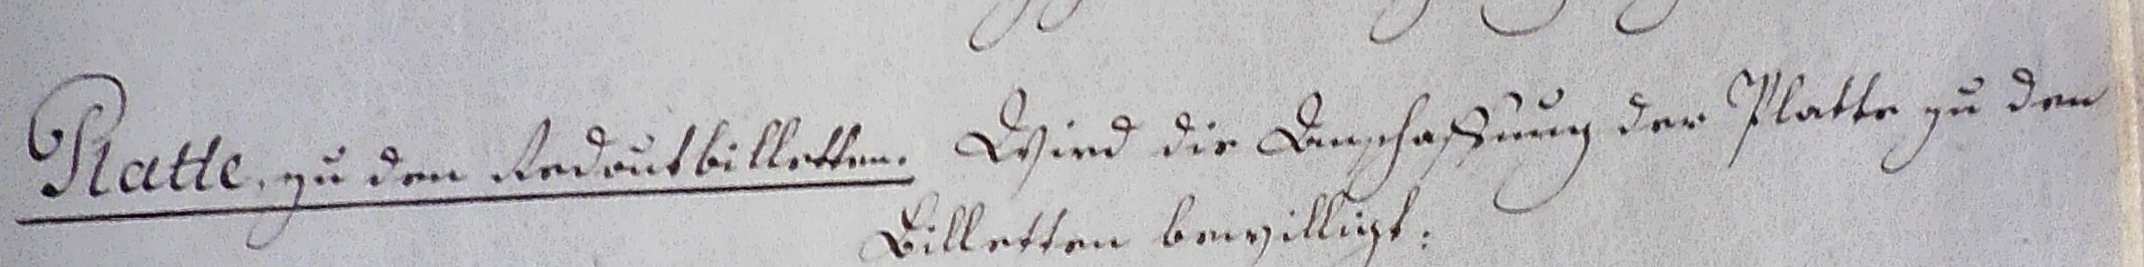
Platte, zu den Redoutbilletten. Wird die Anschaffung der Platte zu den
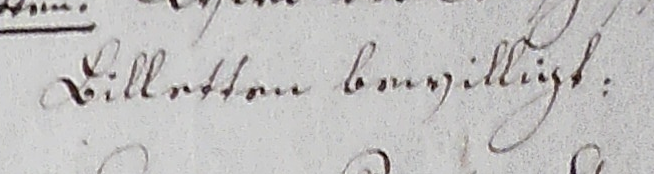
Billetten bewilligt.
